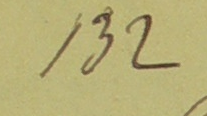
132
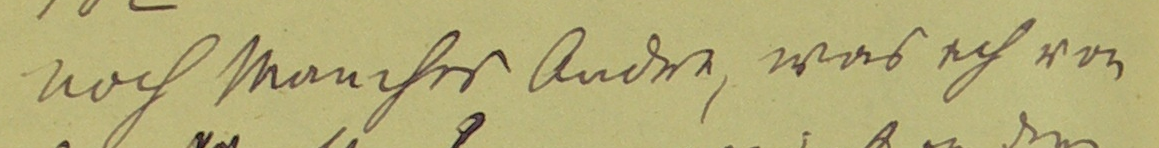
noch manches Andere, was ich von
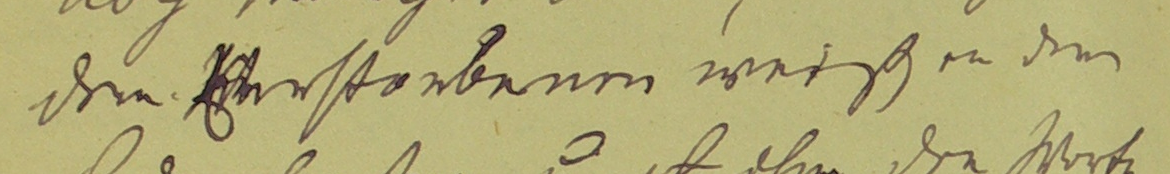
dem Verstorbenen weiß in der
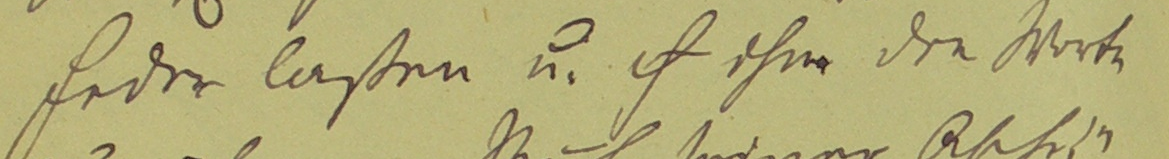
Feder laßen und auch ihm die Worte
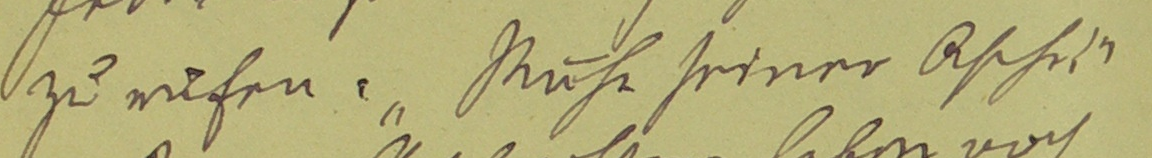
zurufen:“ Ruhe seiner Asche“ .-
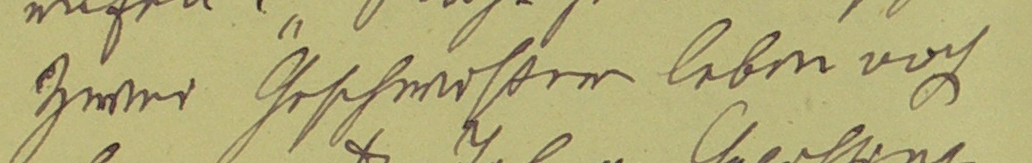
Zwei Geschwister leben noch
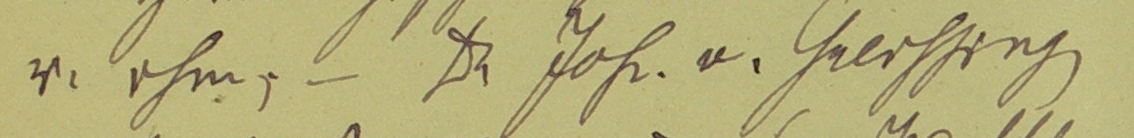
von ihm ,-Dr. Joh. von Gerssing
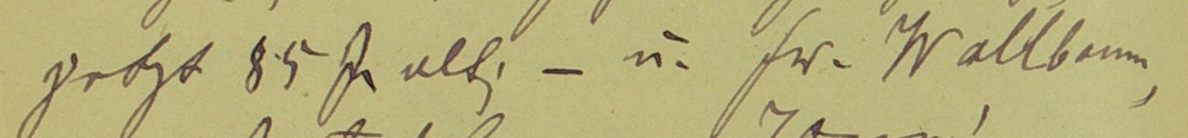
jetzt 85 Jahre alt.- und Fr. Wallbaum
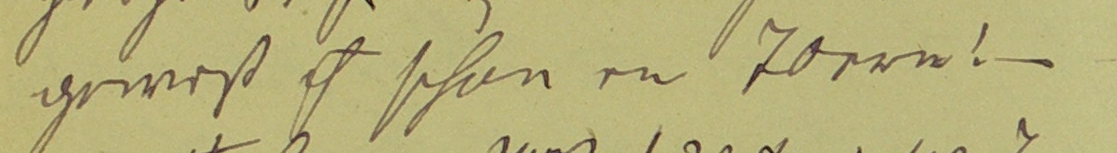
gewiß schon in den 70- ern.-
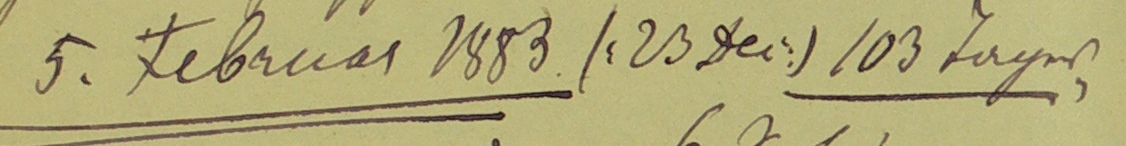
5. Februar 1883 (: 23 Dez: ) 103 Tages¬
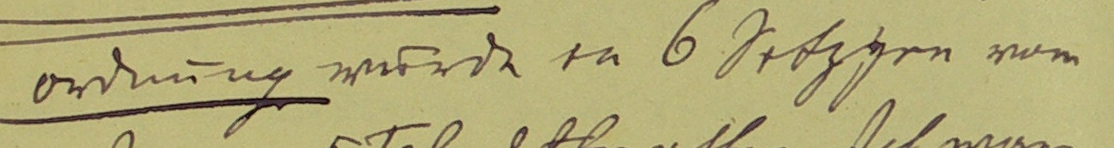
ordnung wurde in 6 Sitzungen vom
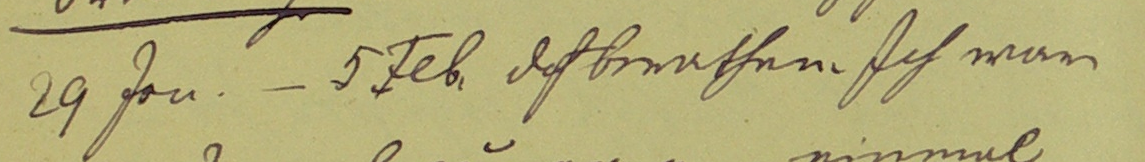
29. Jan.-5. Febr. durchberathen. Ich war
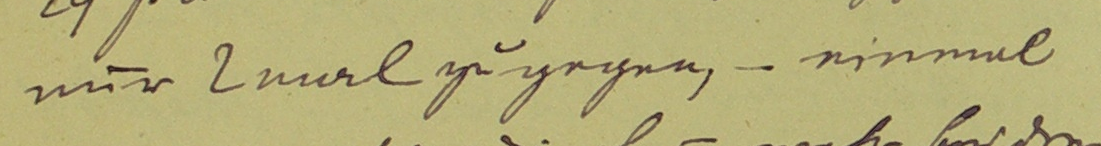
nur 2-mal zugegen,- einmal
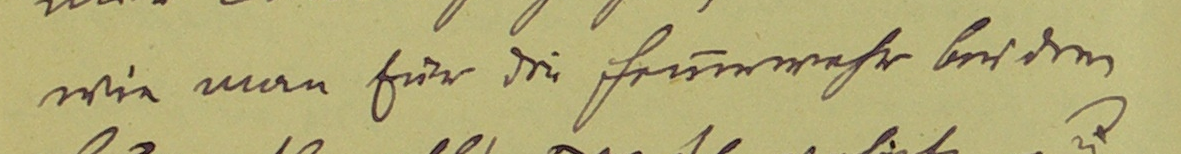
wie man für die Feuerwehr bei der
